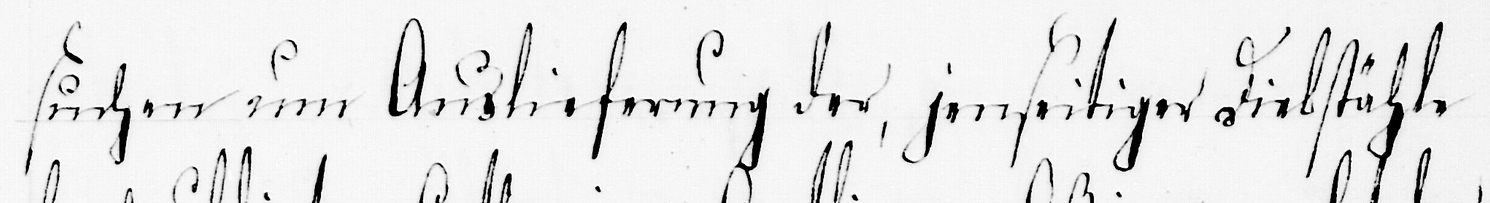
suchen um Auslieferung der, jenseitiger Diebstähle
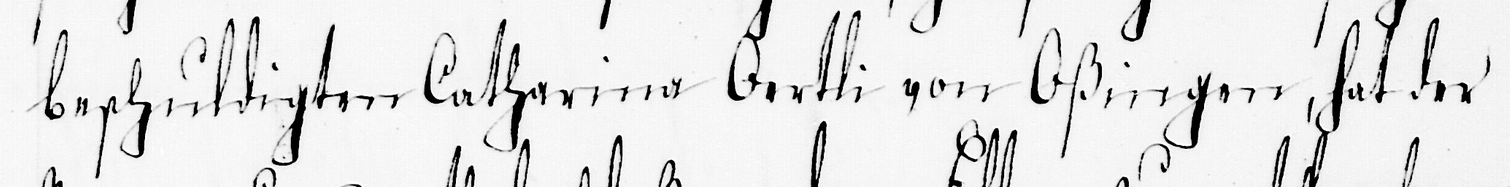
beschuldigten Catharina Oertli von Oßingen, hat der
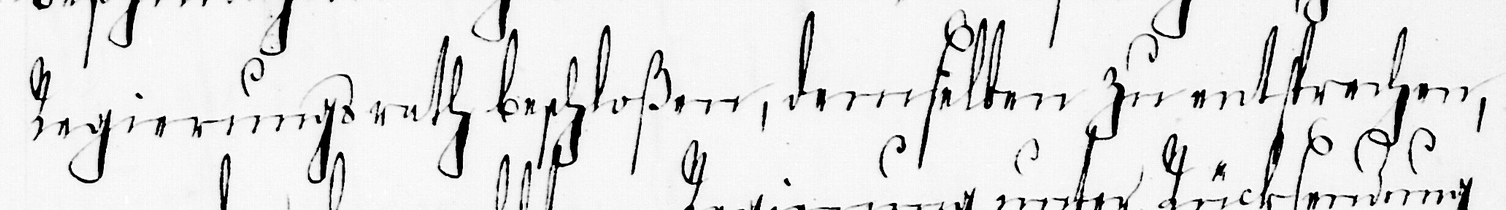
Regierungsrath beschloßen, demselben zu entsprechen,
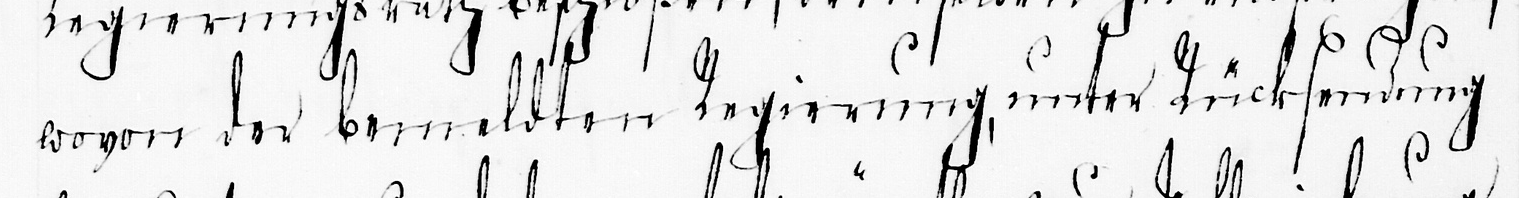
wovon der bemeldten Regierung, unter Rücksendung
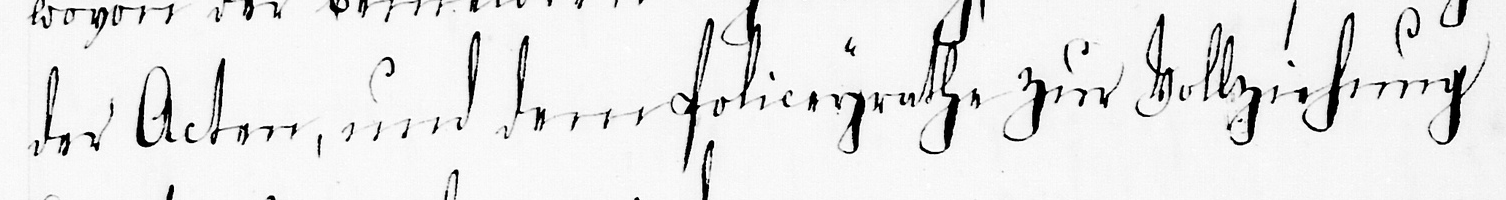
der Acten, und dem Policeyrathe zur Vollziehung
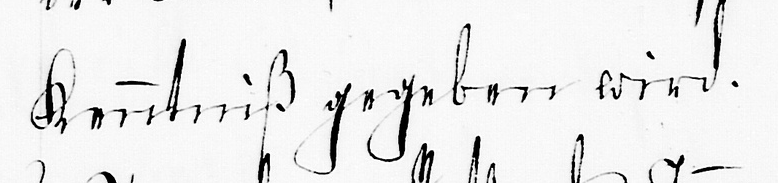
Kenntniß gegeben wird.
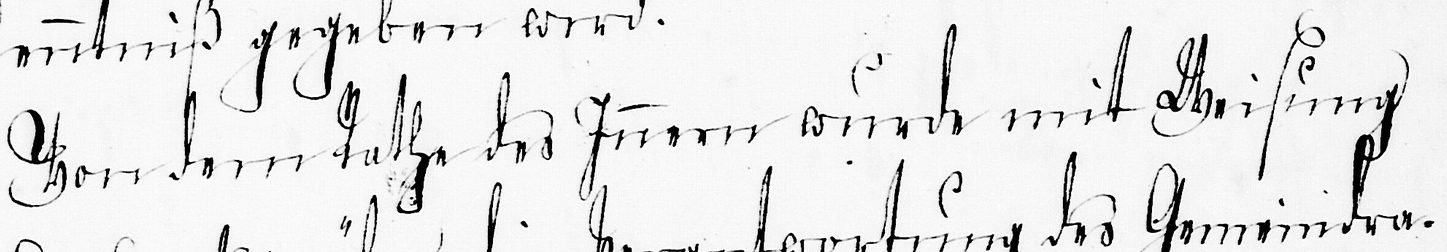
Von dem Rathe des Innern wurde mit Weisung
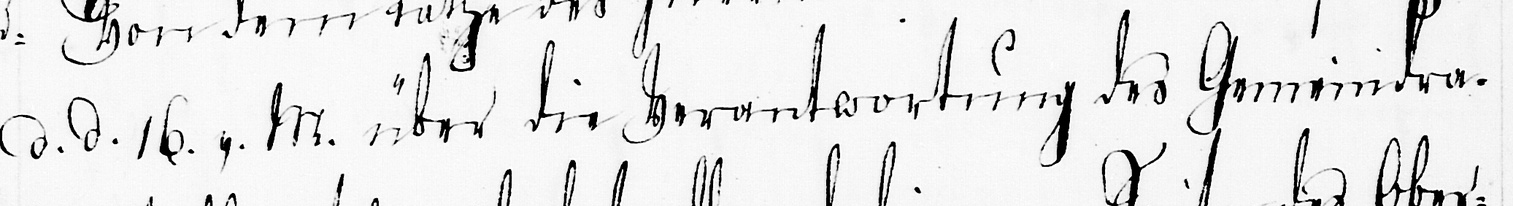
d. d. 16. v. M. über die Verantwortung des Gemeindra¬
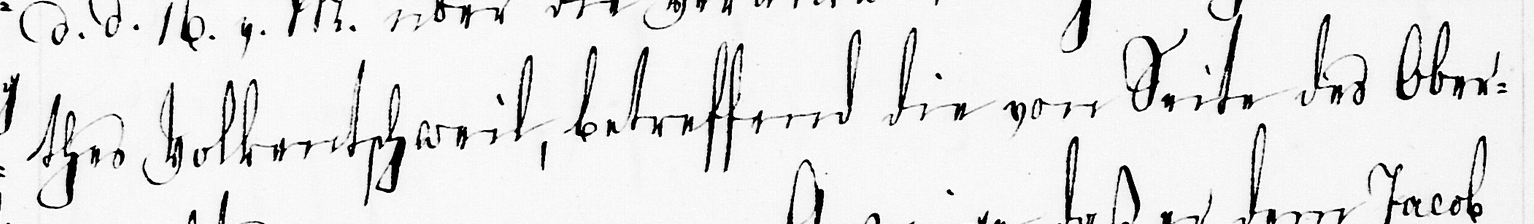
thes Volkentschweil, betreffend die von Seite des Ober¬
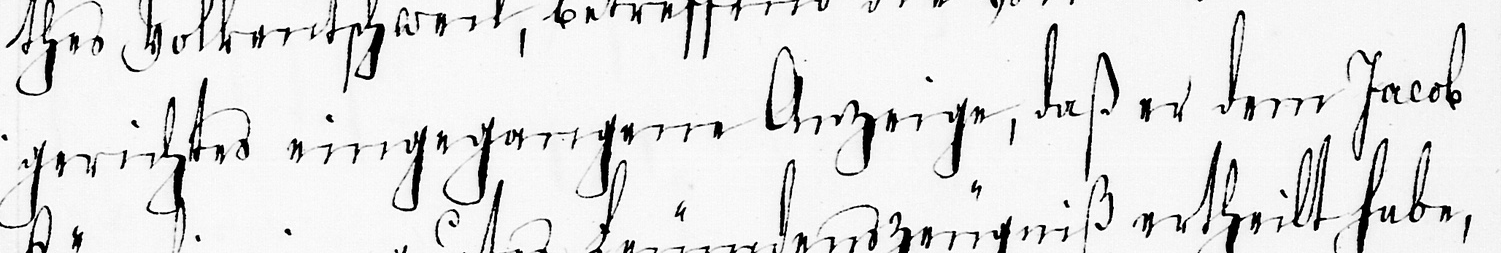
gerichtes eingegangene Anzeige, daß er dem Jacob
